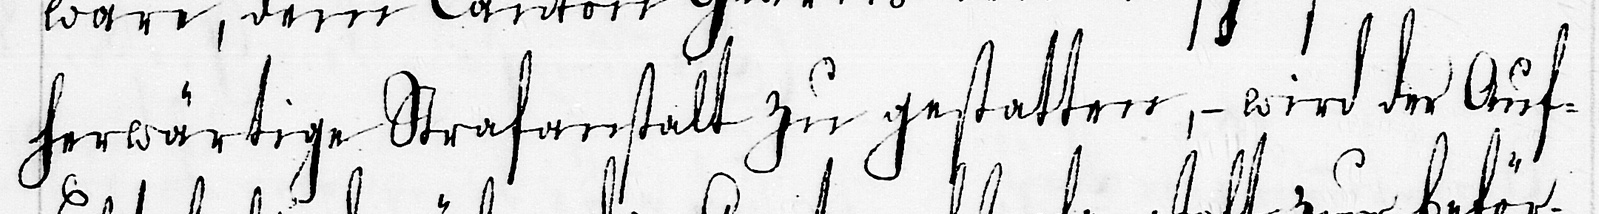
herwärtige Strafanstalt zu gestatten, – wird der Auf¬
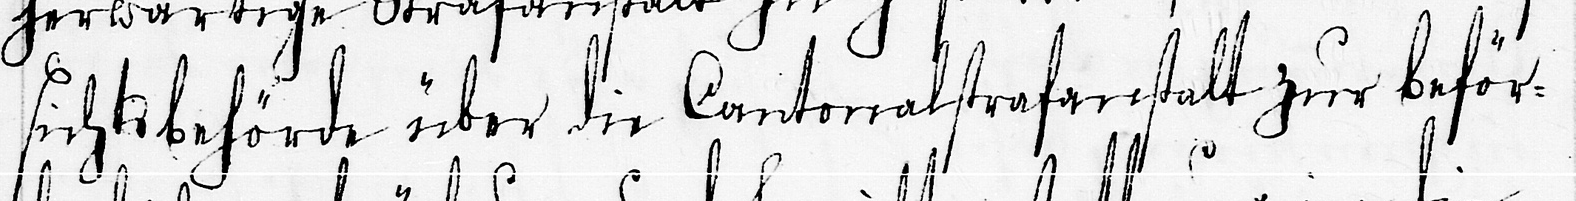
sichtsbehörde über die Cantonalstrafanstalt zur beför¬
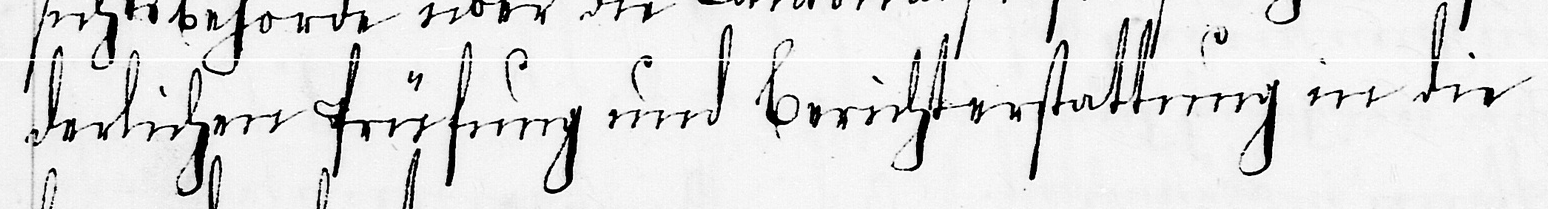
derlichen Prüfung und Berichterstattung in die
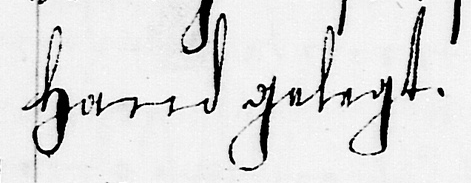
Hand gelegt.
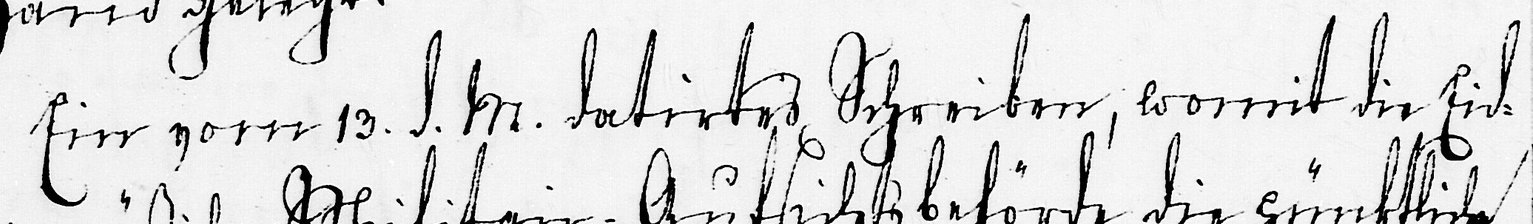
Ein vom 13. d. M. datirtes Schreiben, womit die Eid¬
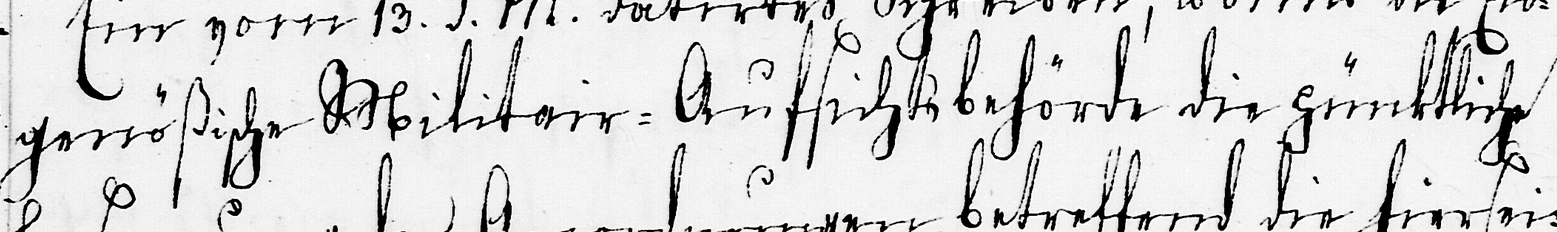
genößische Militair-Aufsichtsbehörde die pünktliche
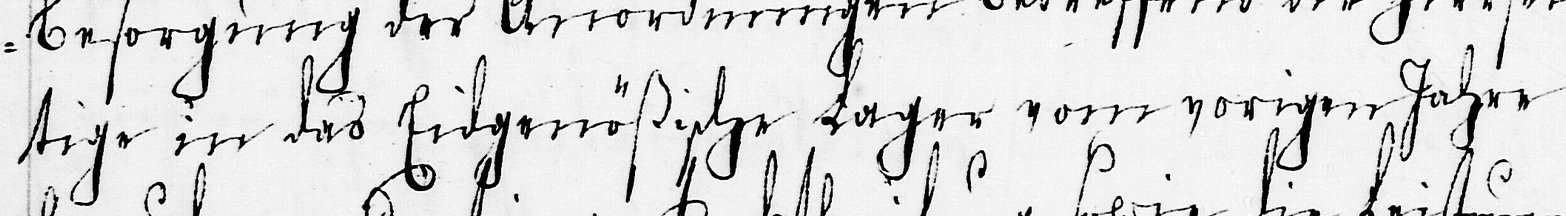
tige in das Eidgenößische Lager vom vorigen Jahre
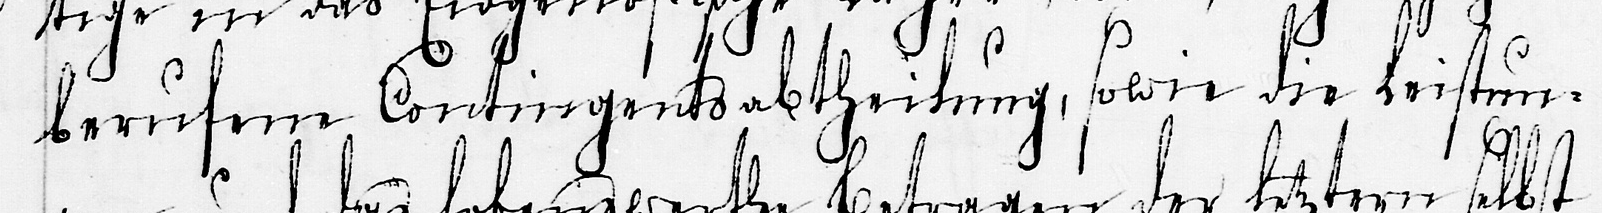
berufene Contingentsabtheilung, sowie die Leistun¬
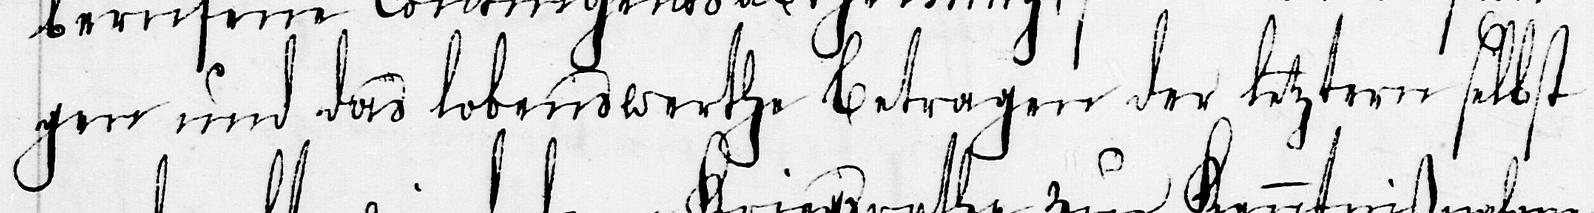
gen und das lobenswerthe Betragen der letztern selbst
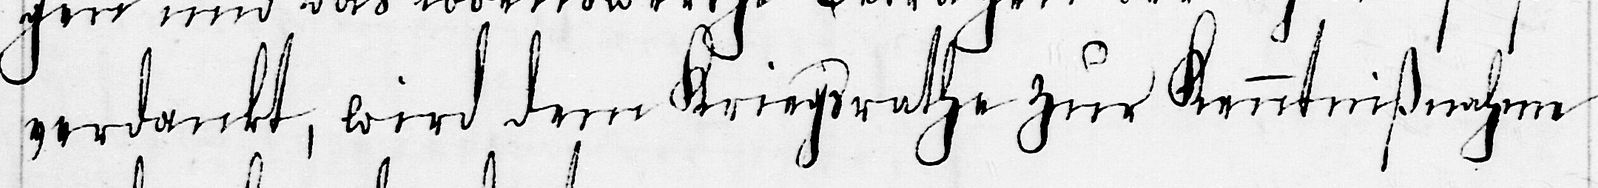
verdankt, wird dem Kriegsrathe zur Kenntnißnahme
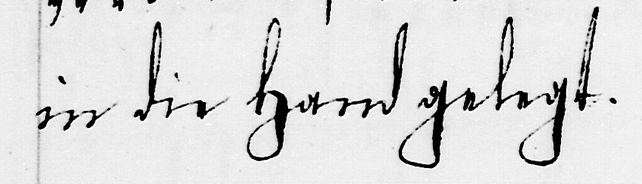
in die Hand gelegt.
